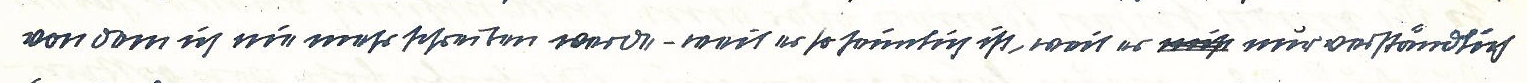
von dem ich nie mehr schreiben werde – weil er so heimlich ist, weil er nur verständlich
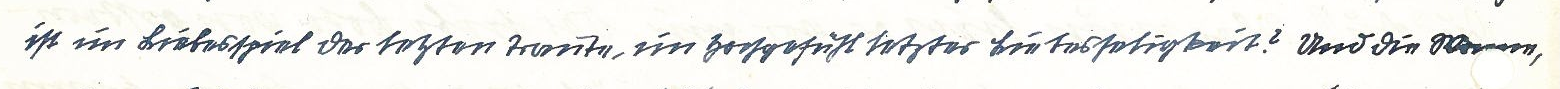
ist im Liebesspiel der letzten Traute, ein Hochgefühl letzter Liebesseligkeit? Und die Wonne,
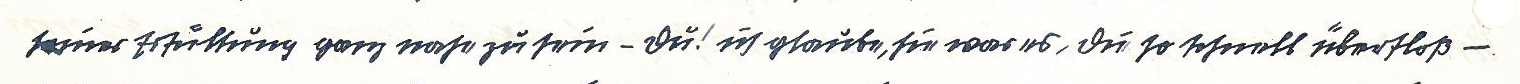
seiner Erfüllung ganz nahe zu sein – Du! ich glaube, sie war es, die so schnell überfloß –
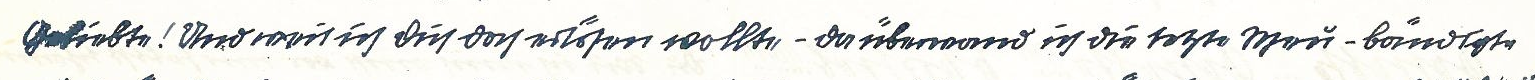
Geliebte! Und weil ich Dich doch erlösen wollte – da überwand ich die letzte Scheu – bändigte
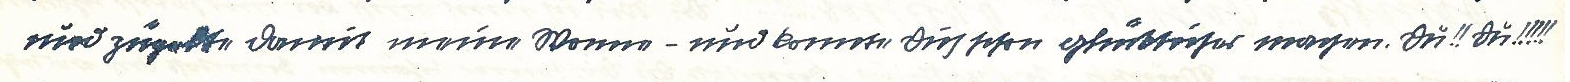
und zügelte damit meine Wonne – und konnte Dich schon glücklicher machen. Du!! Du!!!!!
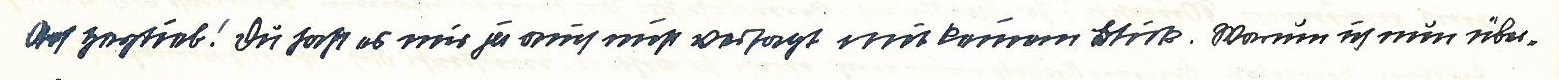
Ach Herzlieb! Du hast es mir ja auch nicht versagt mit Deinem Blick. Warum ich nun über¬
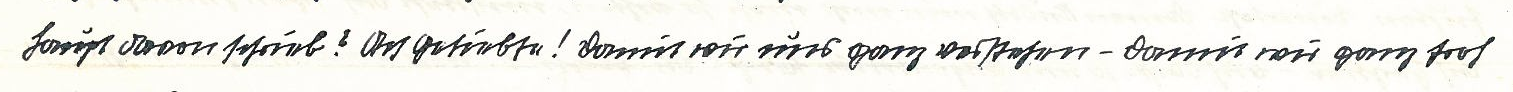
haupt davon schrieb? Ach Geliebte! Damit wir uns ganz verstehen – damit wir ganz froh
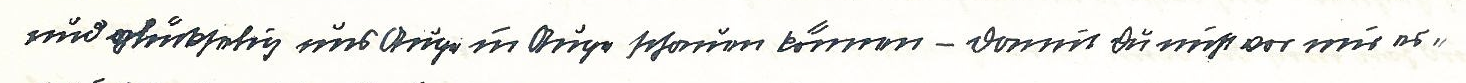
und glückselig uns Auge in Auge schauen können – damit Du nicht vor mir er¬
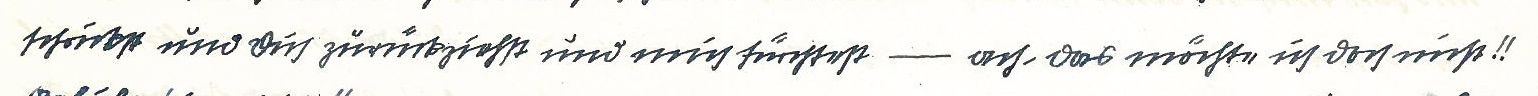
schrickst und Dich zurückziehst und mich fürchtest – – ach, das möchte ich doch nicht!!
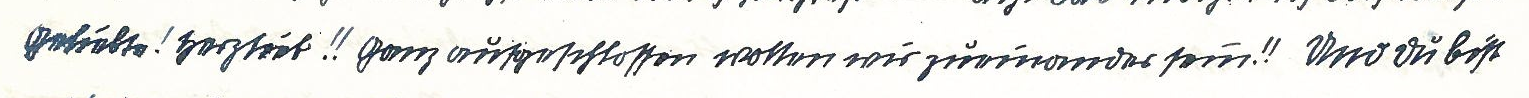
Geliebte! Herzlieb!! Ganz aufgeschlossen wollen wir zueinander sein!! Und Du bist
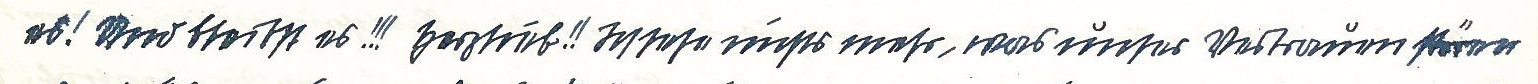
es! Und bleibst es!!! Herzlieb!! Ich sehe nichts mehr, was unser Vertrauen stören
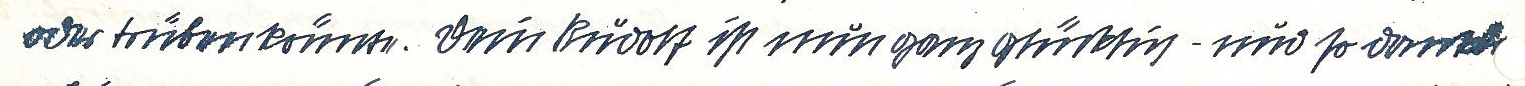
oder trüben könnte. Dein ist nun ganz glücklich – und so dankbar
